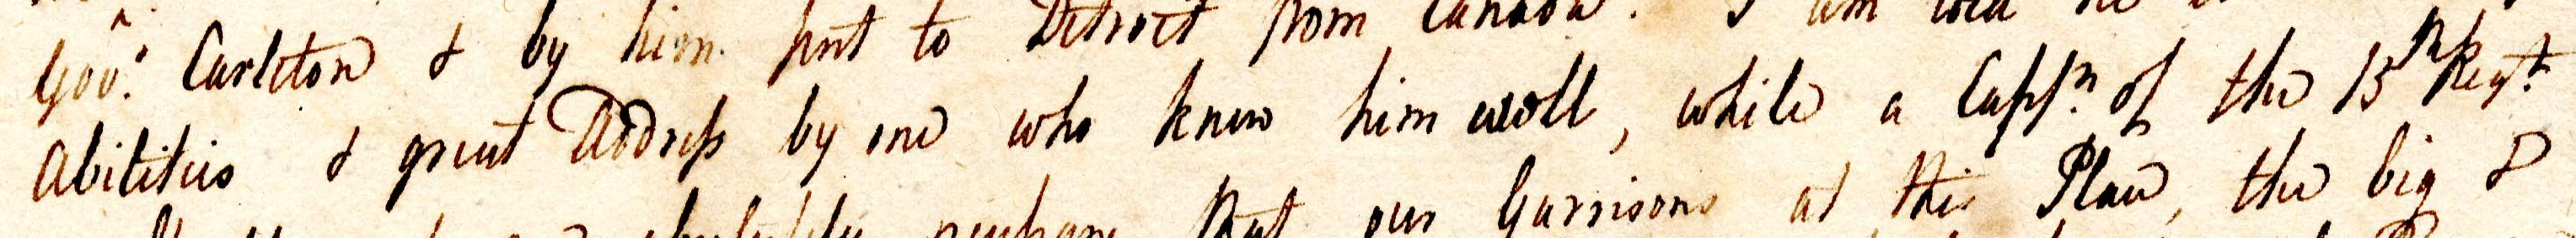abilities & great Address by one who knew him well, while a Capt^n. of the 15^th Reg^t.
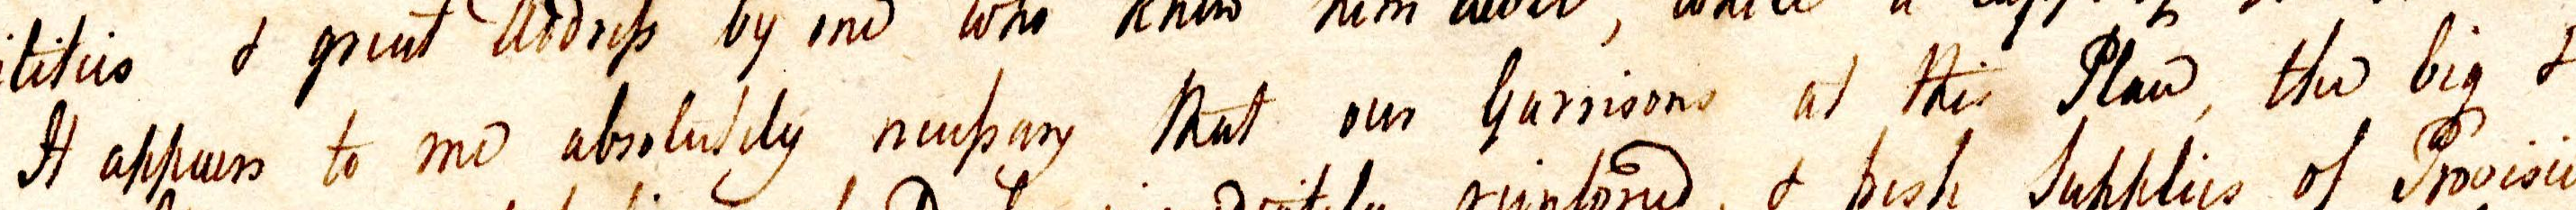It appears to me absolutely necessary that our Garrisons at this Place, the big &
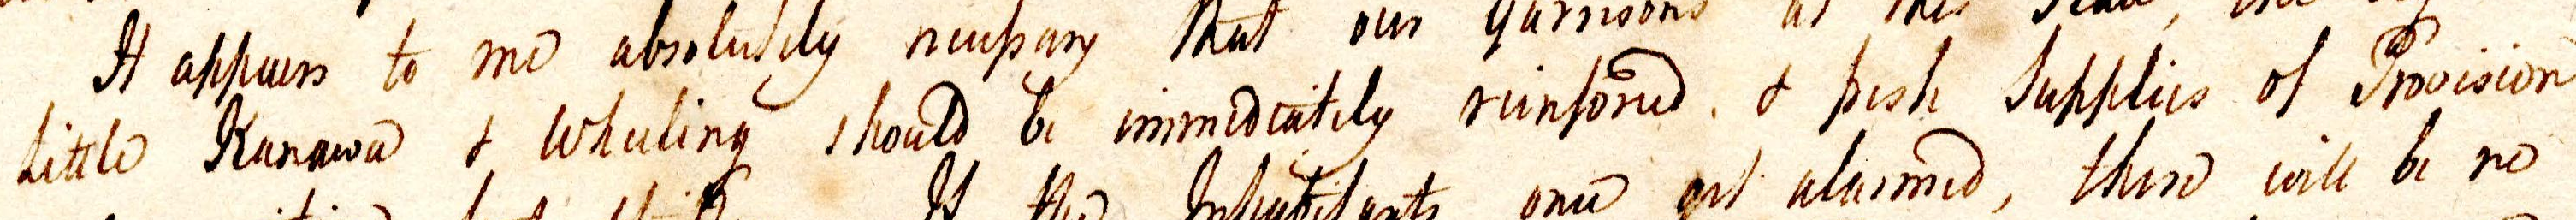Little Kanawa & Wheeling should be immediately reinforced & fresh Supplies of Provision
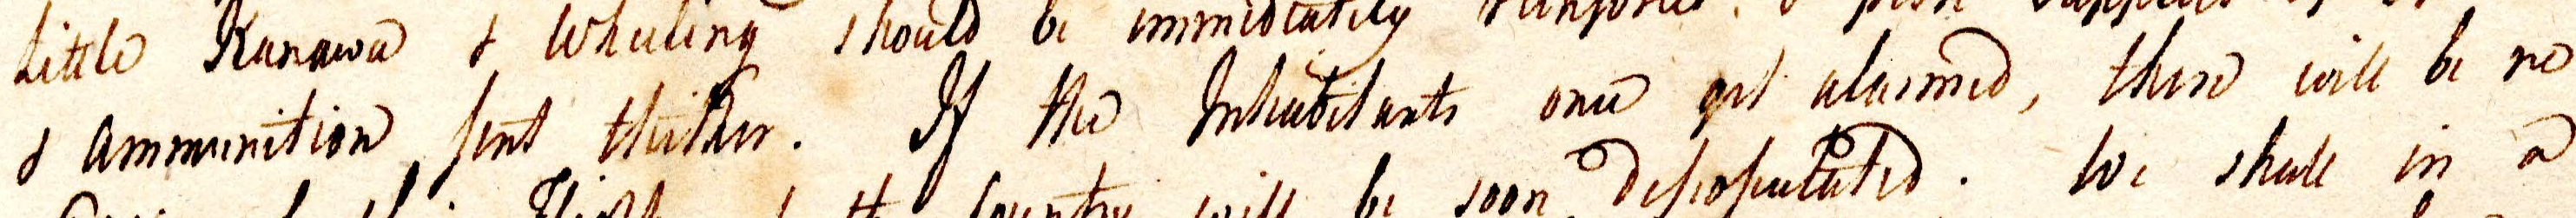& ammunition, sent thither. If the Inhabitants once get alarmed, there will be no
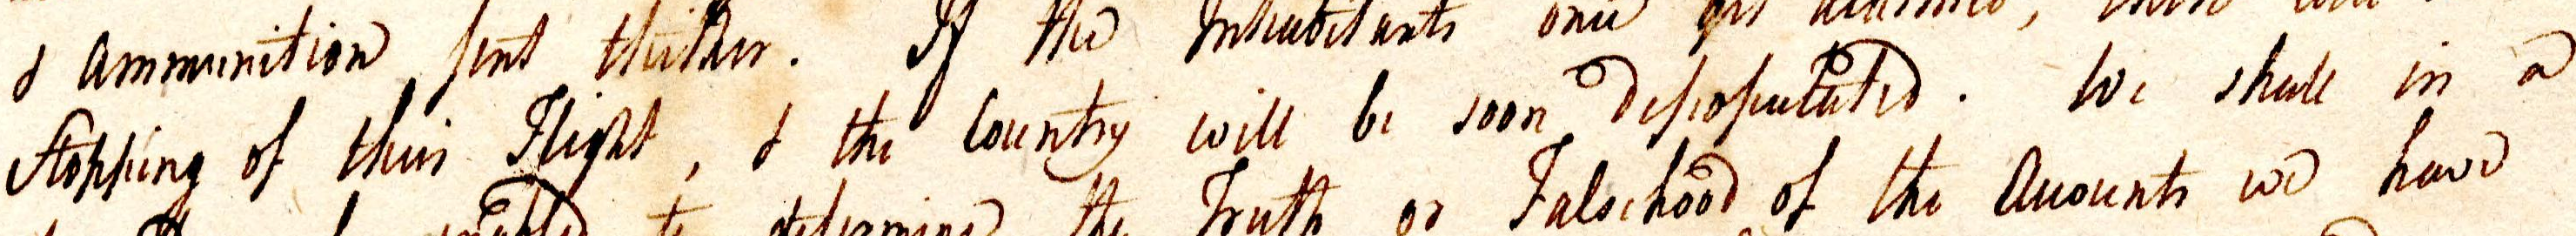Stopping of this Flight, & the country will be soon depopulated. We shall in a
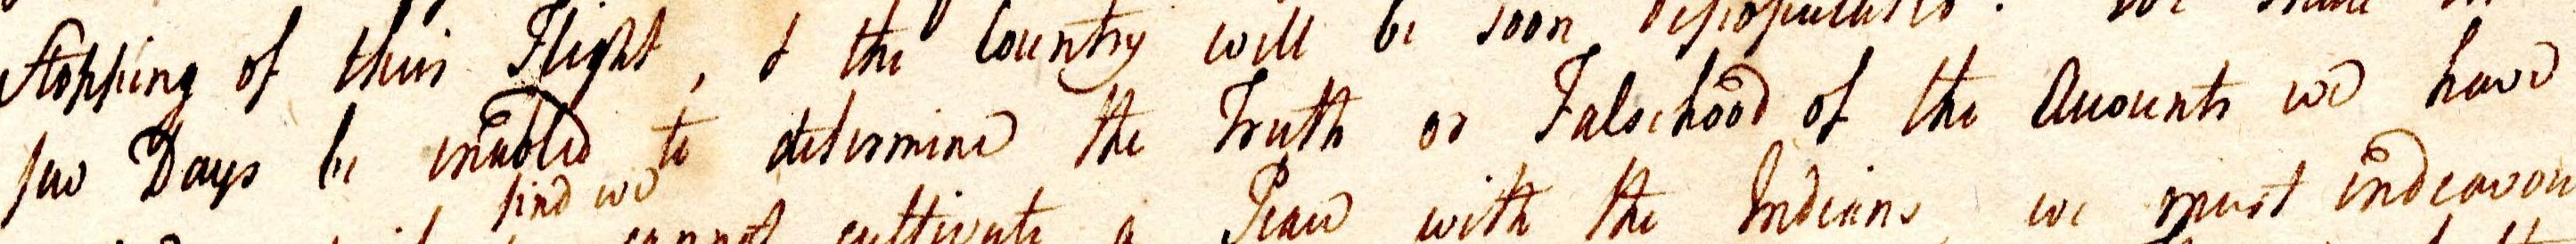few Days be enabled to determine the Truth or Falsehood of the Accounts we have
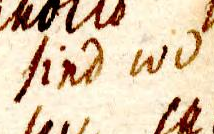find we
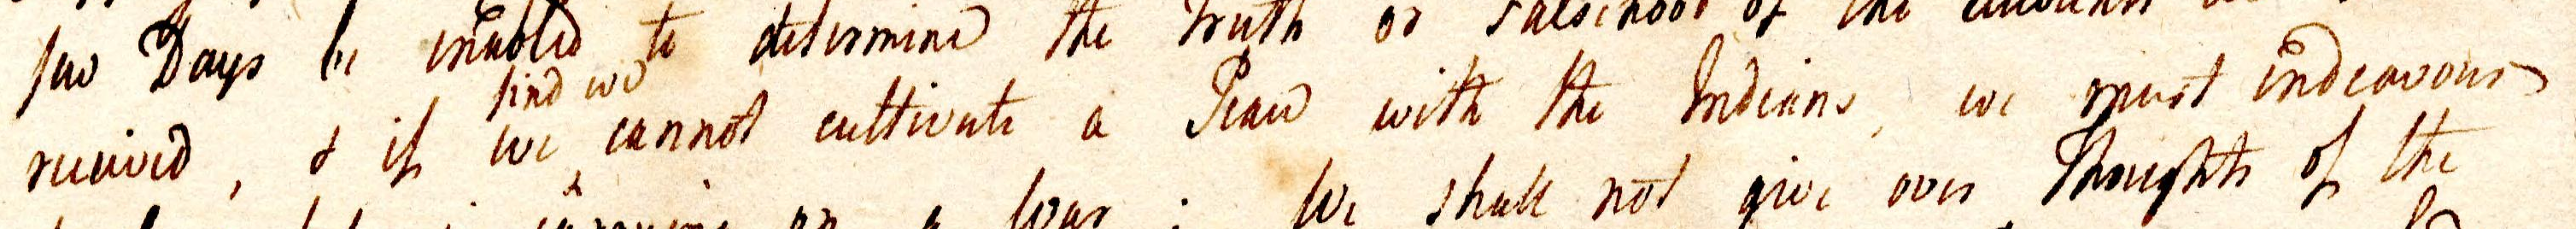received, & if we ^ cannot cultivate a Peace with the Indians, we must endeavour
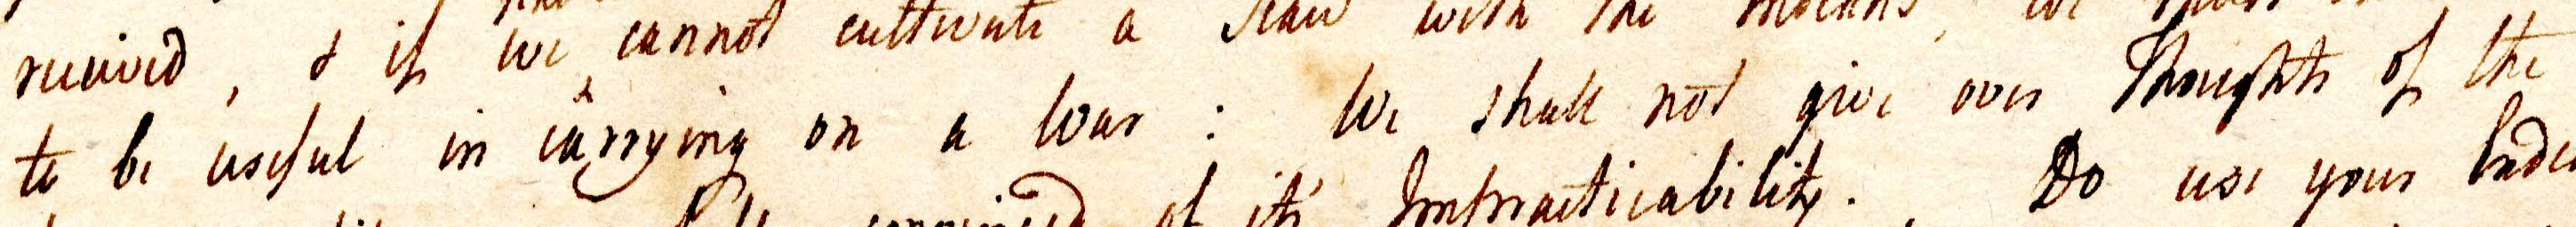to be useful in carrying on a War: We shall not give our Thoughts of the
